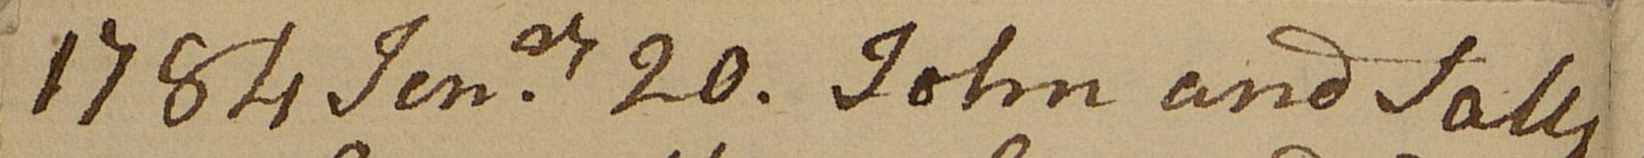1784 Jen^ry. 20. John and Sally
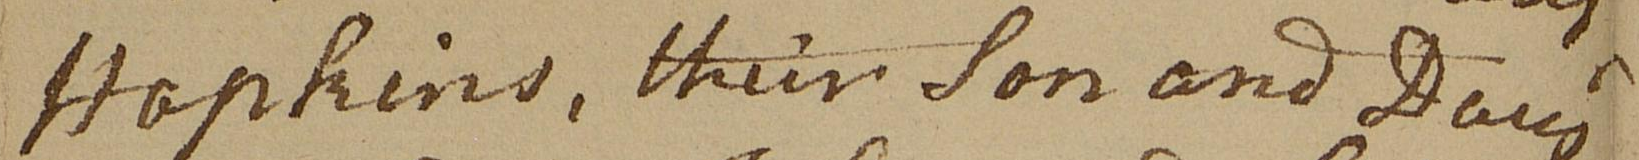Hopkins, their Son and Daug^r
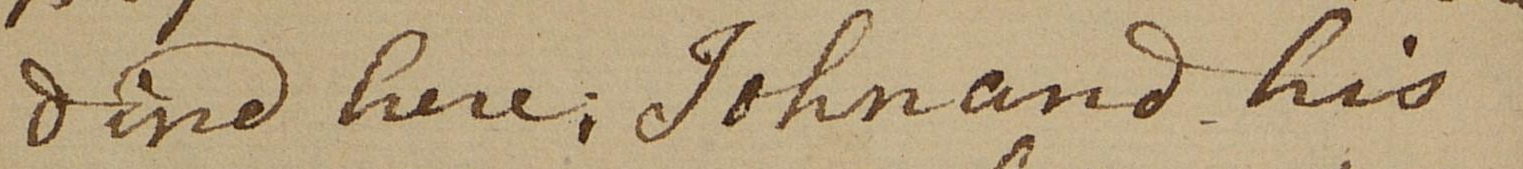dind here; John and his
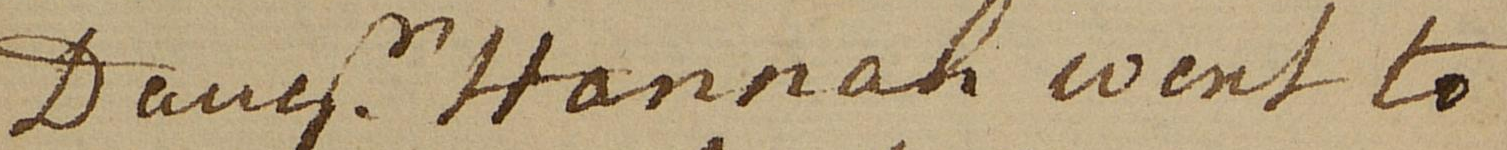Daug^r. Hannah went to
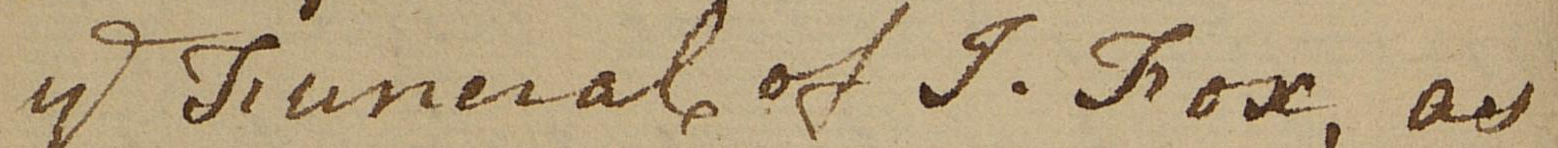y^e Funeral of J. Fox, as
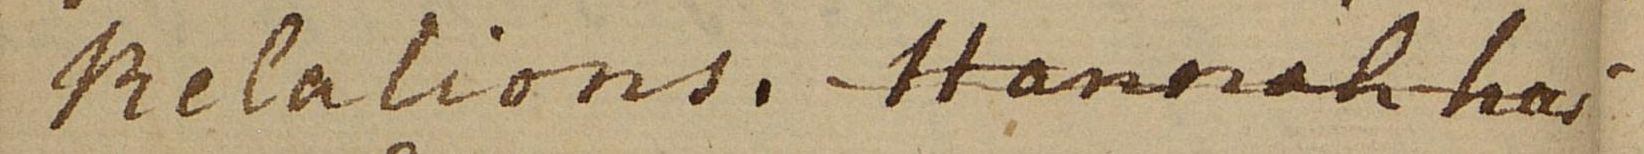Relations. Hannah has
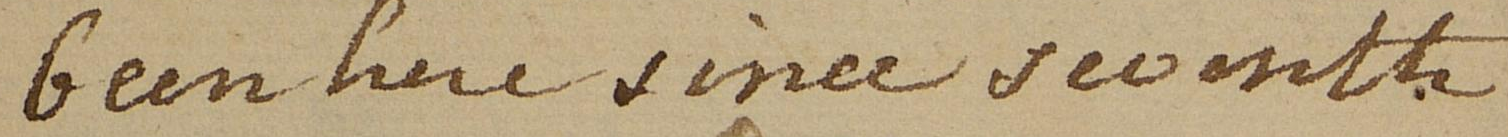been here since seventh
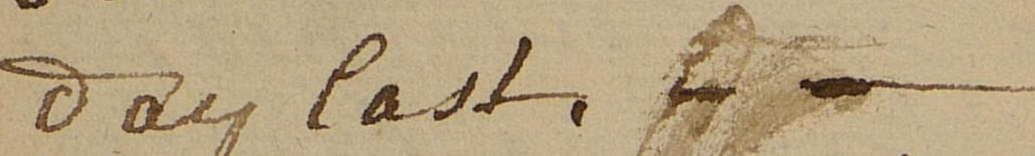day last,--
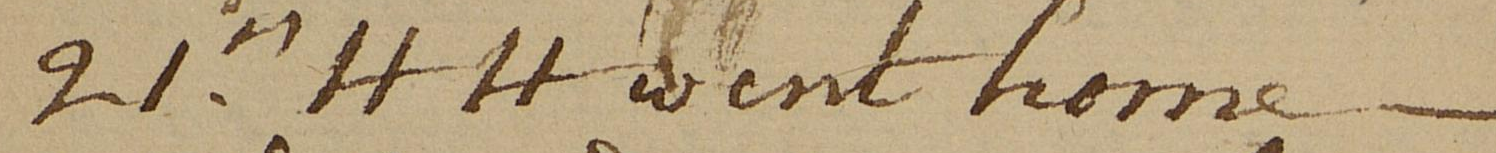21^sts HH went home-
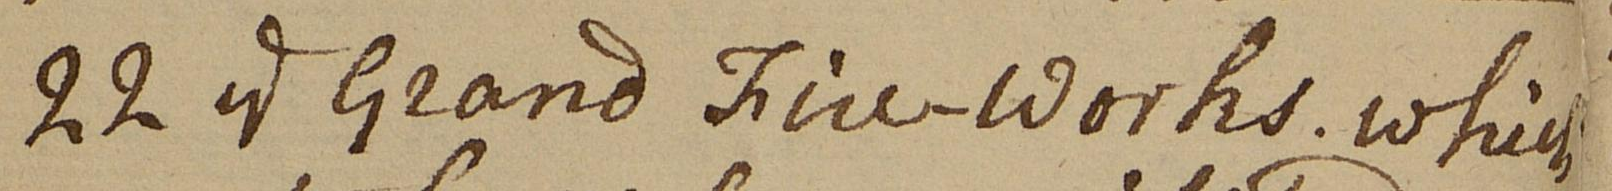22 y^e Grand Fire-Works. which
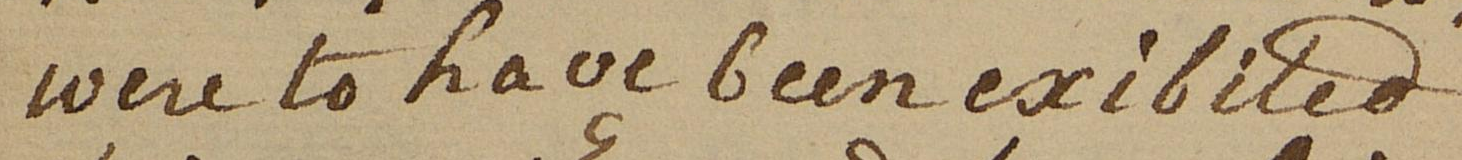were to have been exibited
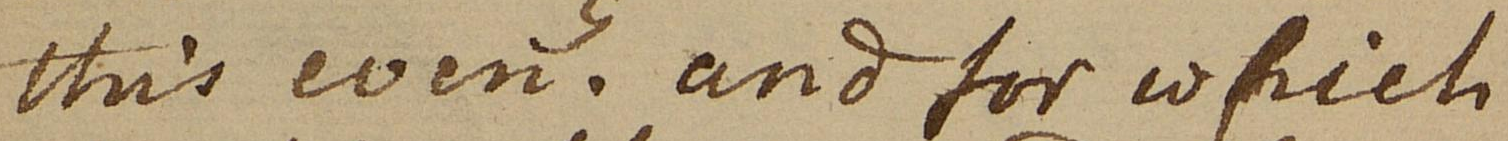this even^g. and for which
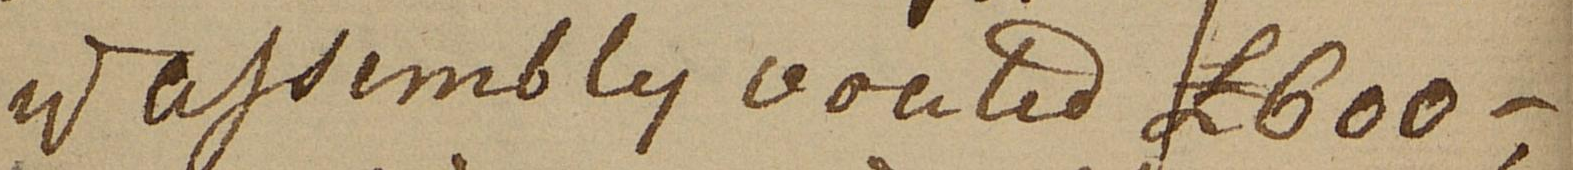y^e assembly vouted £600-
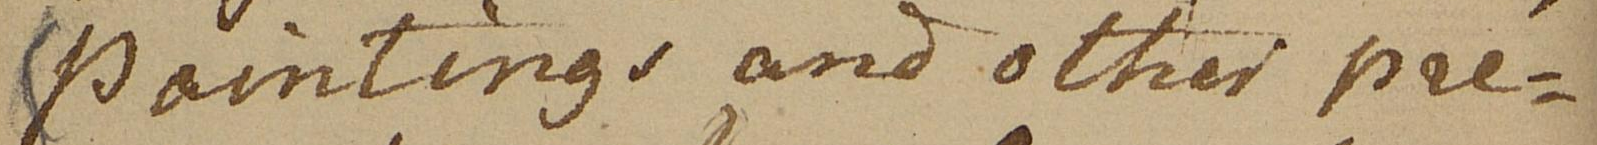(Paintings and other pre-
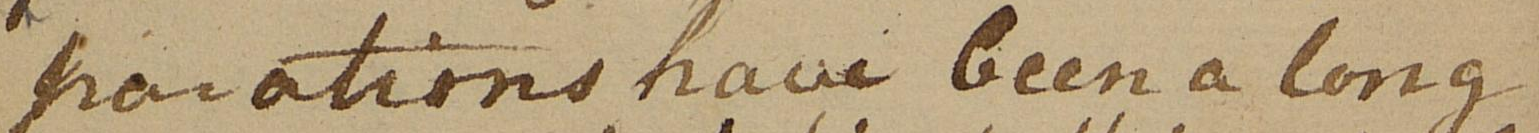parations have been a long
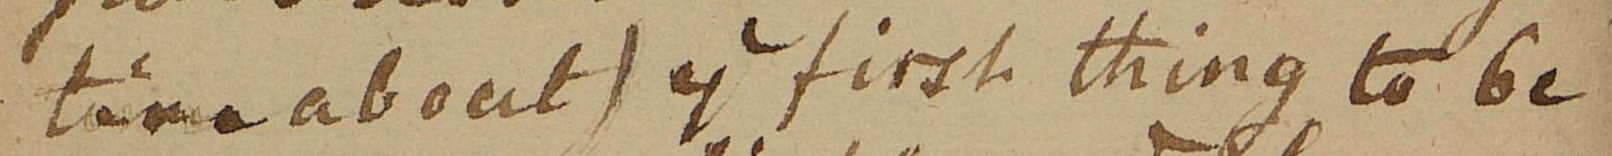time about) y^e first thing to be
